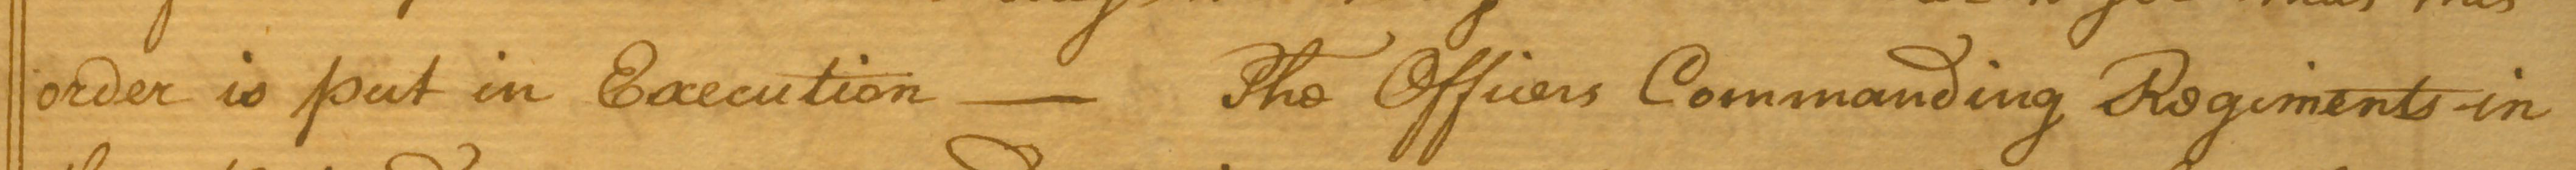order is put in Execution- The Officers Commanding Regiments in
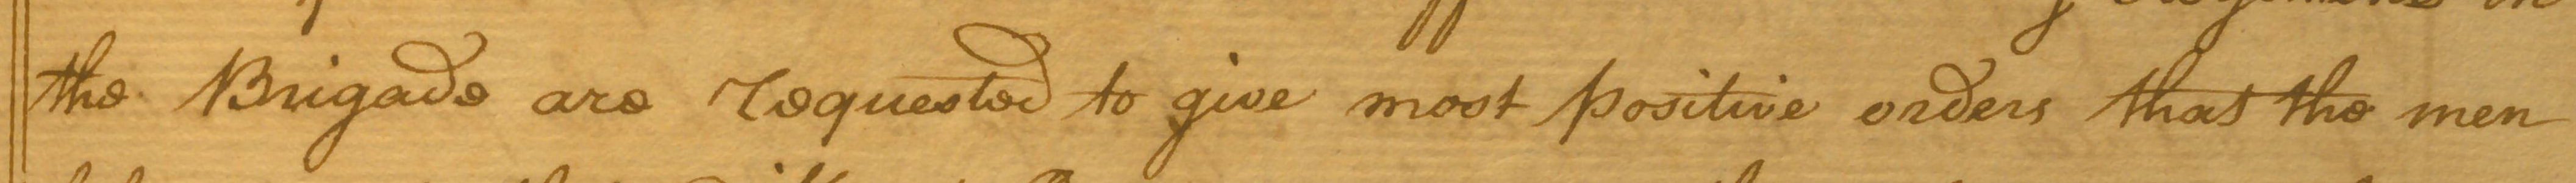the Brigade are requested to give most positive orders that the men
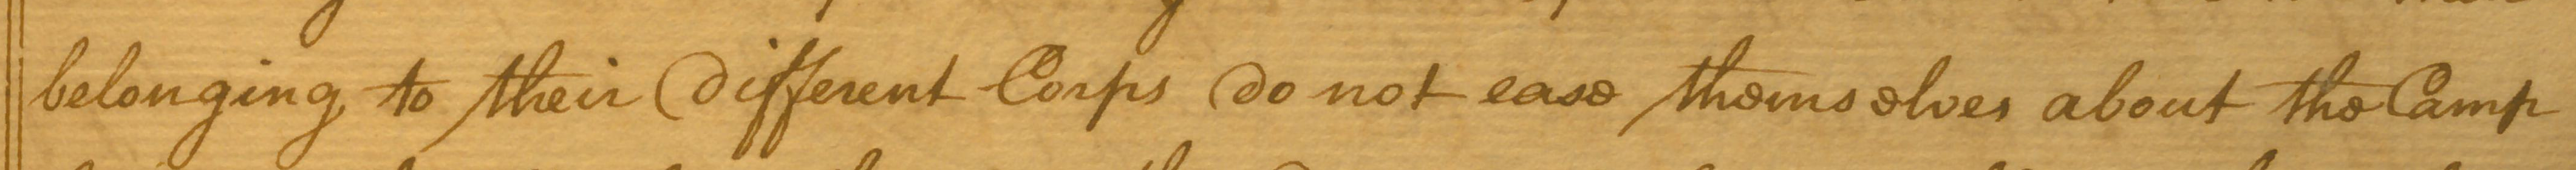belonging to their different Corps do not ease themselves about the Camp
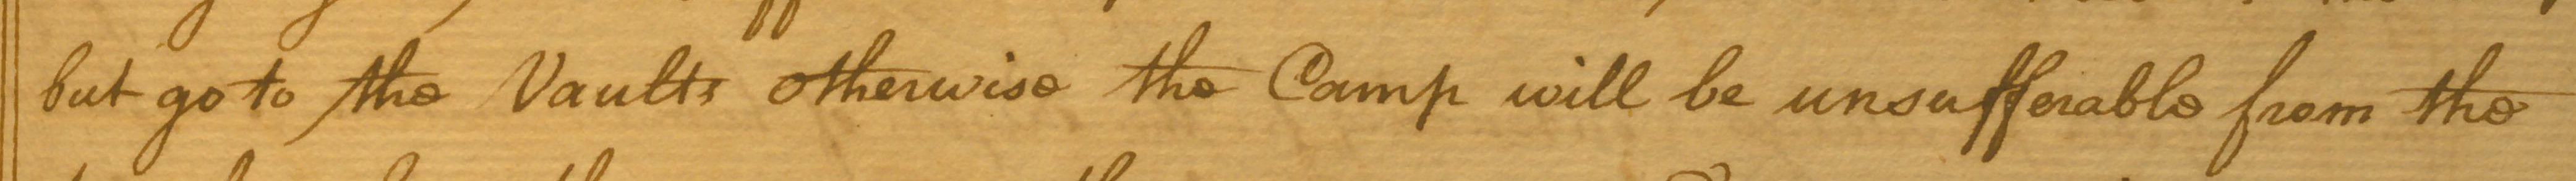but go to the Vaults otherwise the Camp will be unsufferable from the
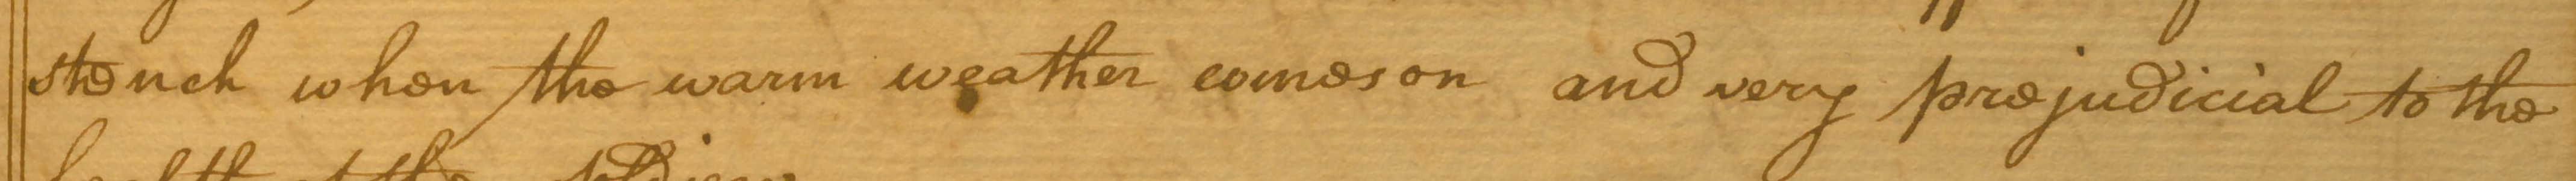stench when the warm weather comes on and very prejudicial to the
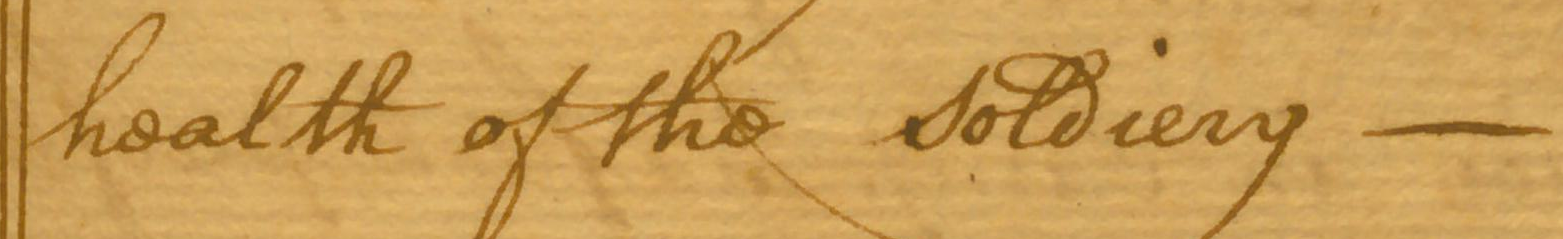health of the soldiery-
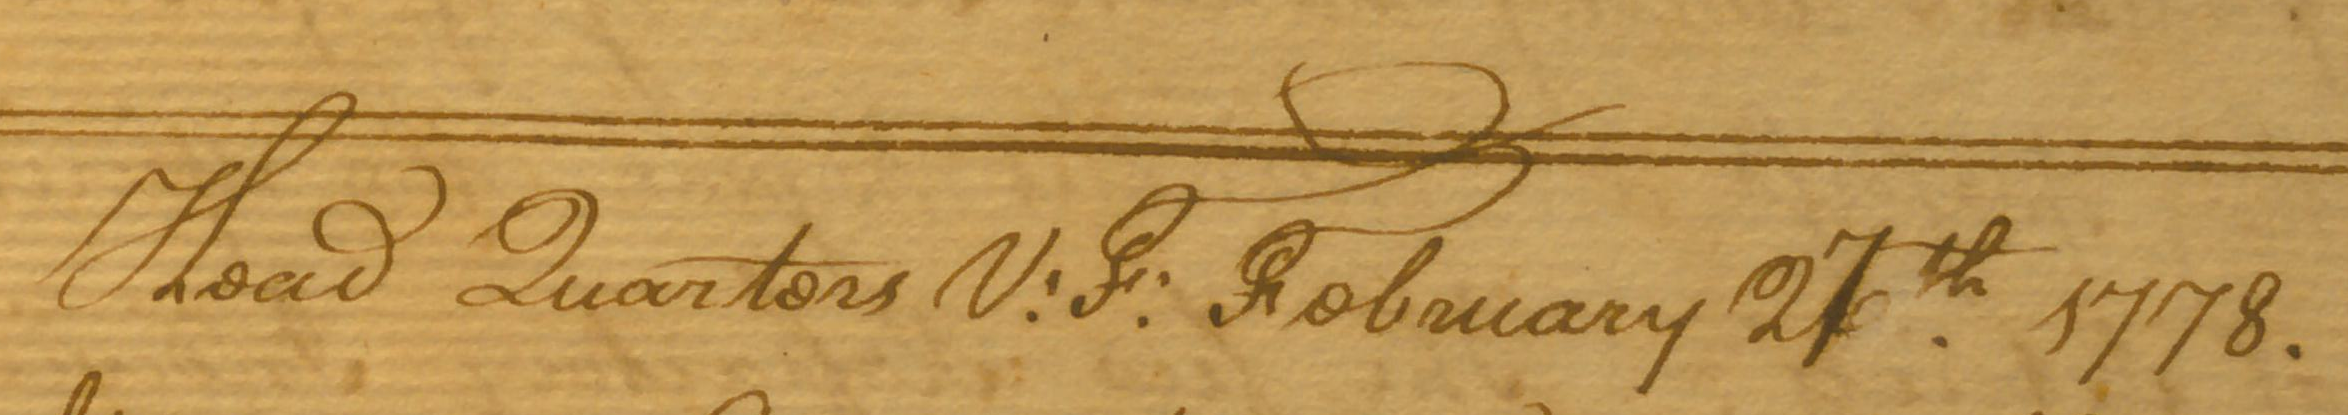Head Quarters V: F: February 27^th. 1778.
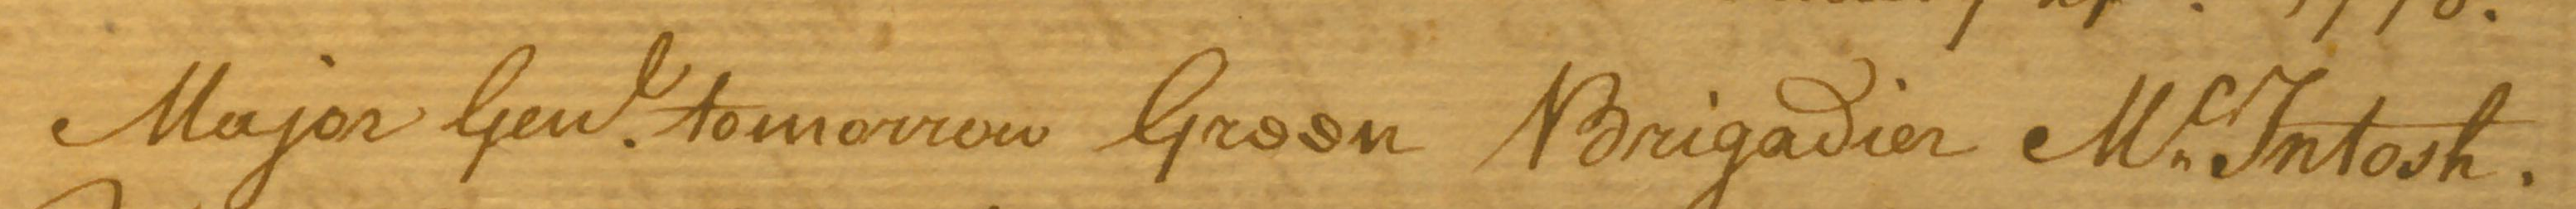Major Gen^l. tomorrow Green Brigadier M^c.Intosh.
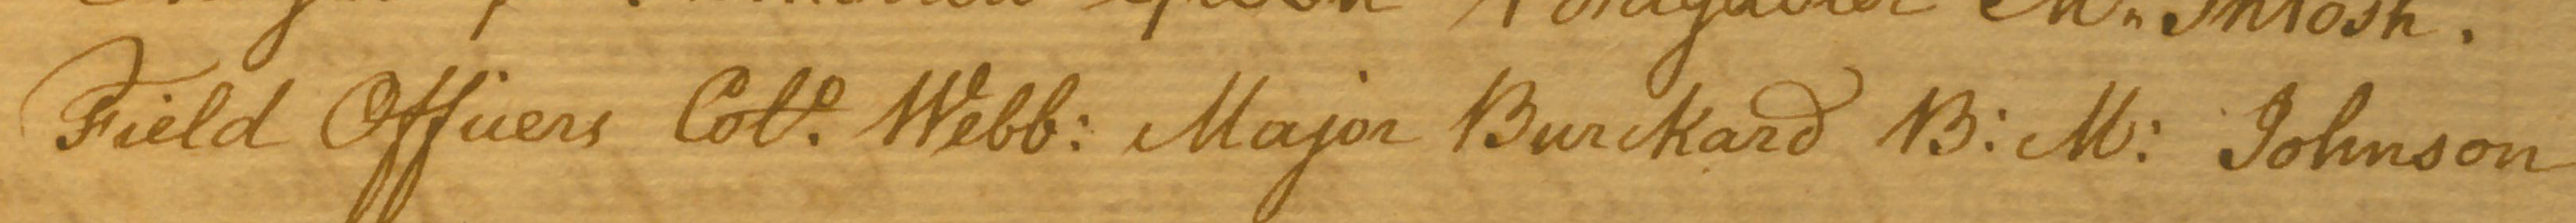Field Officers Col^o. Webb: Major Burckard B: M: Johnson
